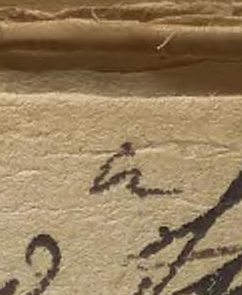a
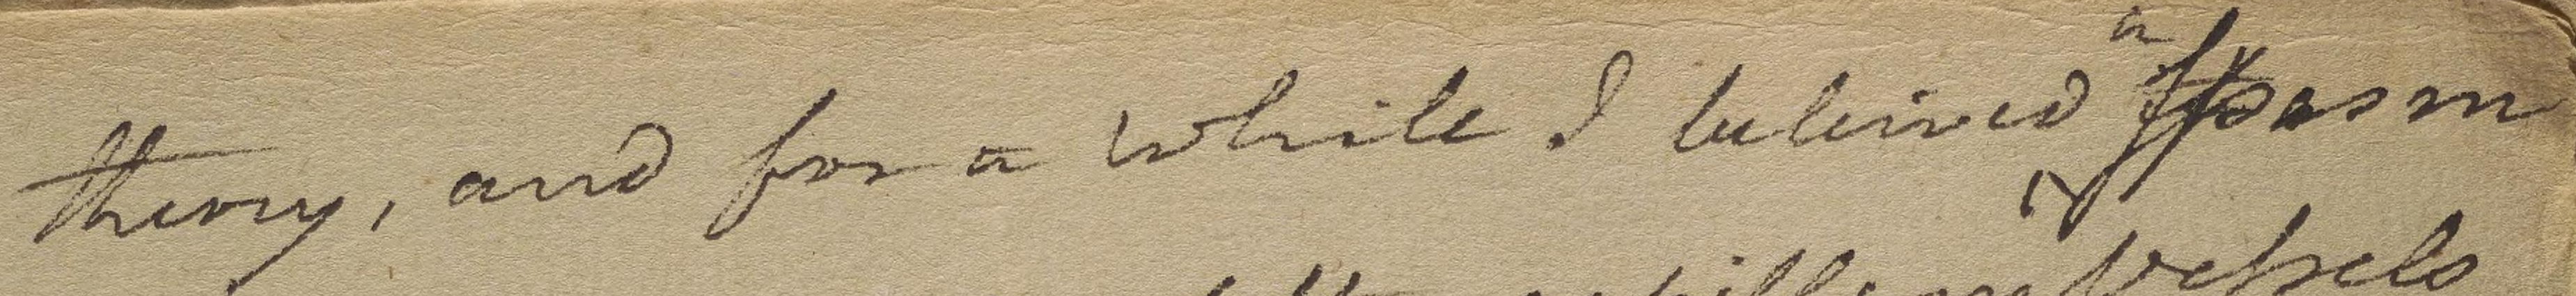theory, and for a while I believed ^ spasm
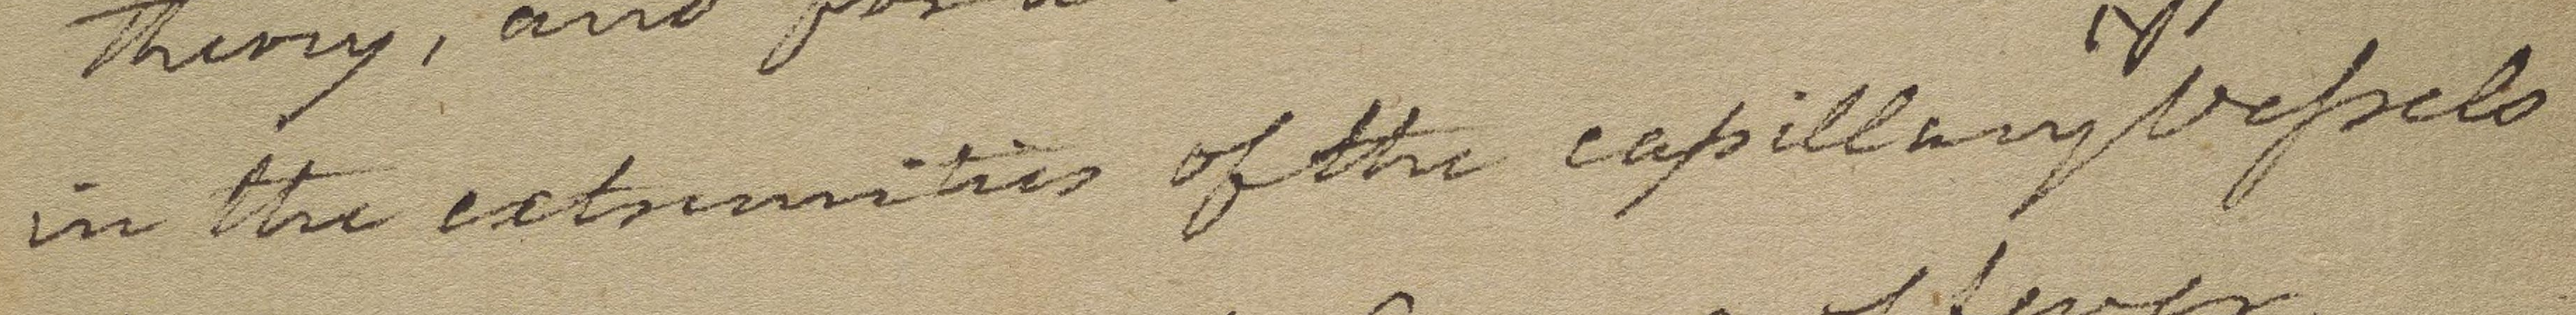in the extremities of the capillary vessels
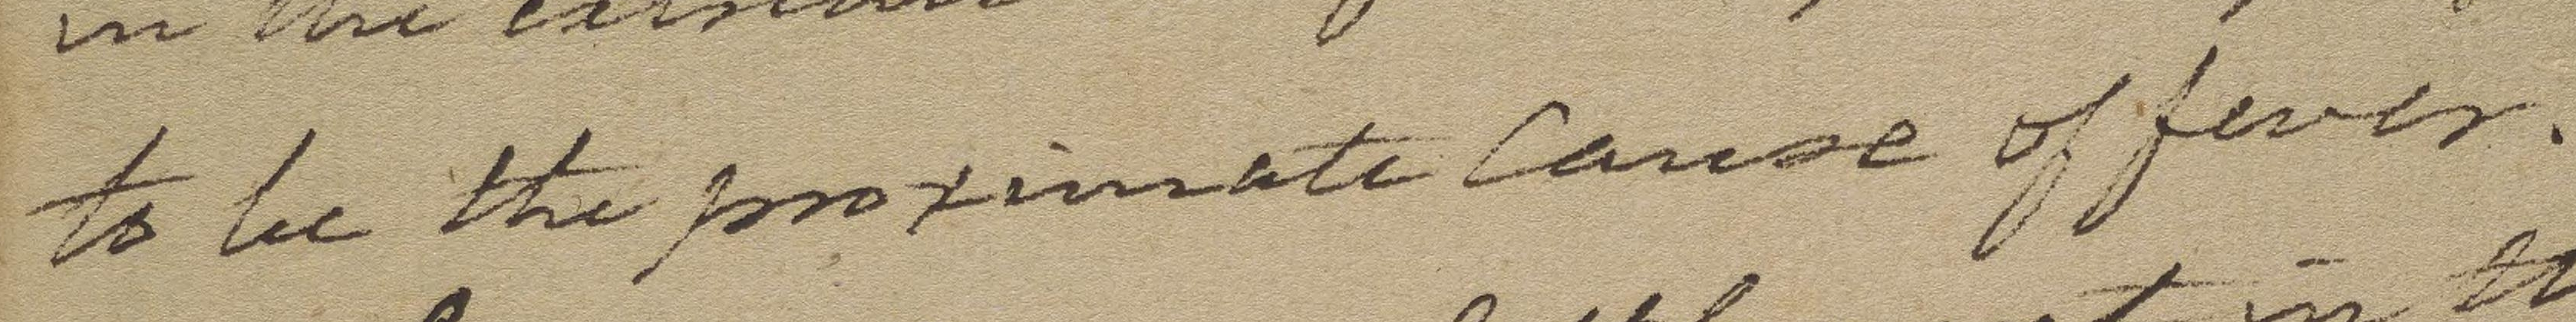to be the proximate cause of fever.
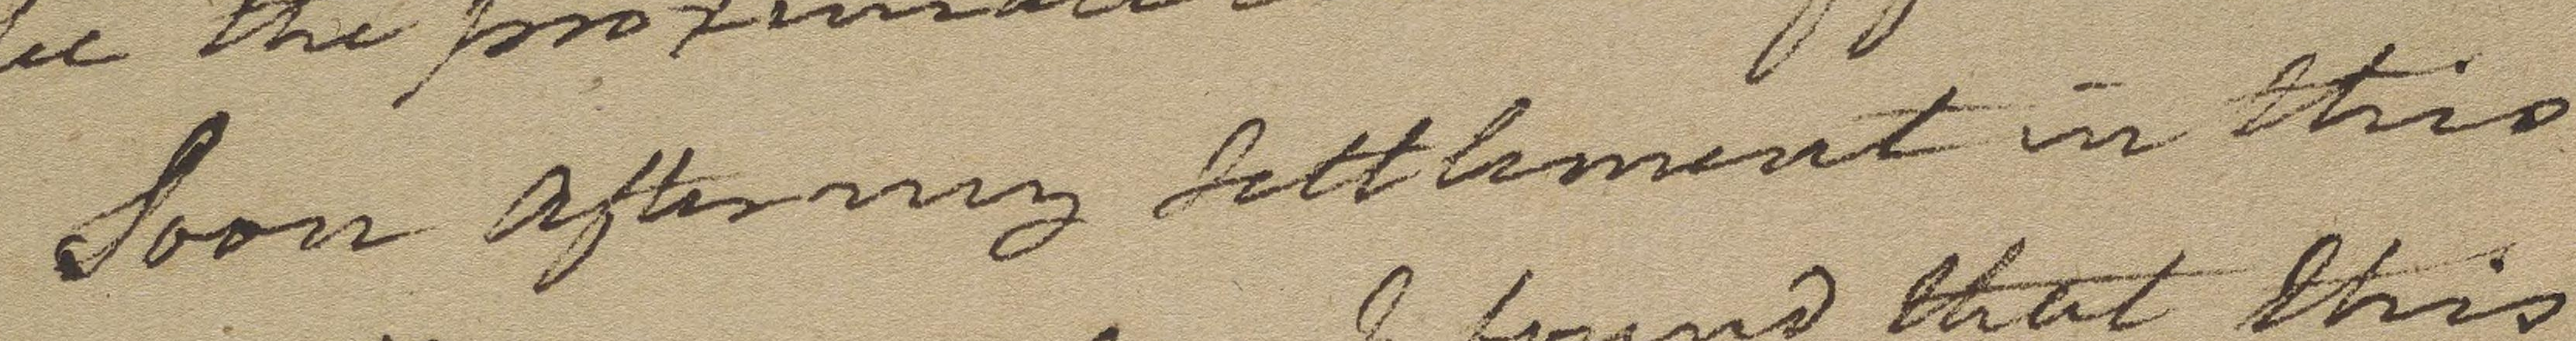Soon after my settlement in this
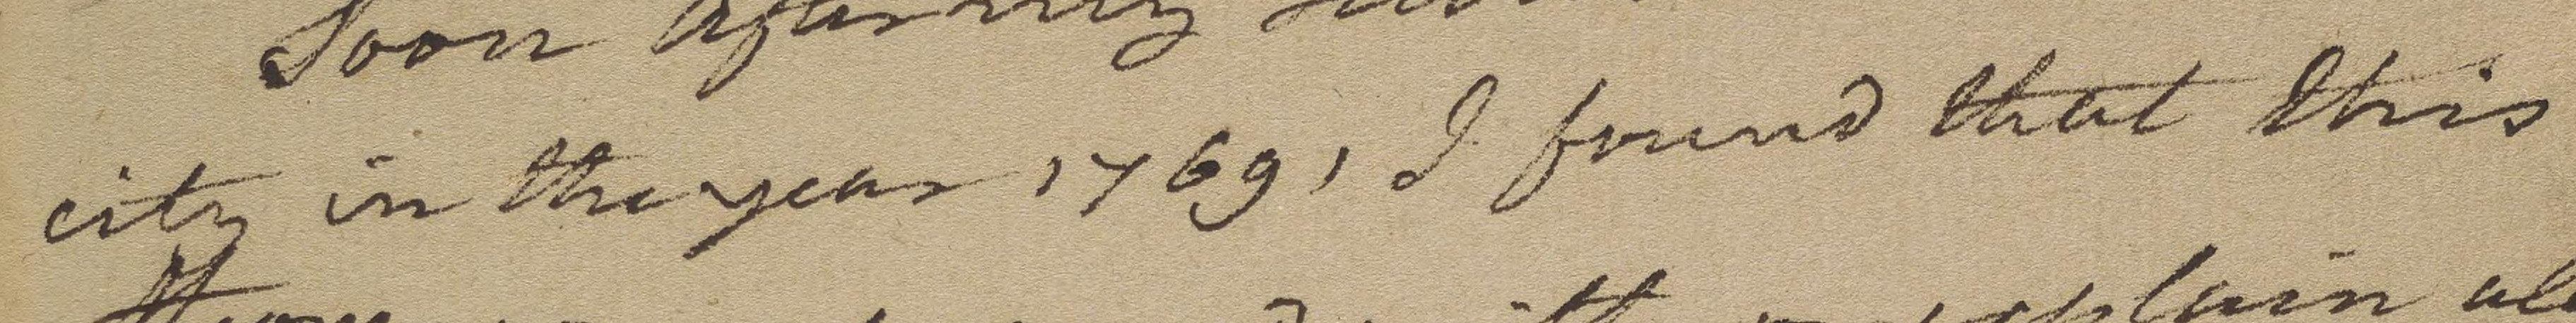city in the year 1769, I found that this
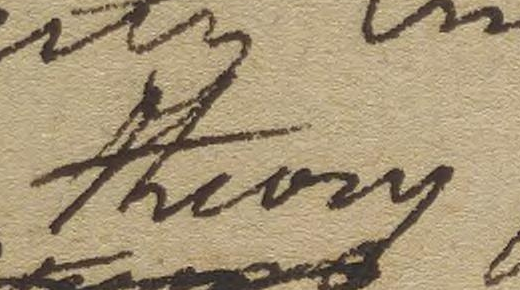theory
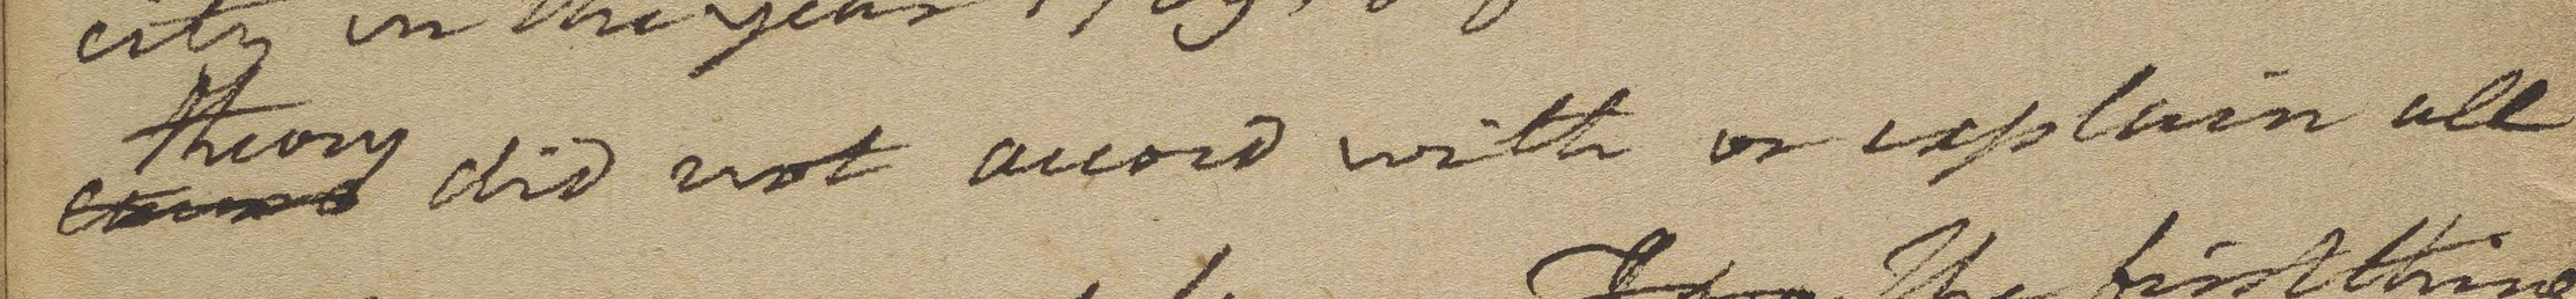[cause] did not accord with or explain all
